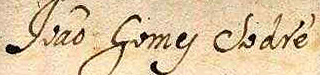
Ioão Gomes Sodré
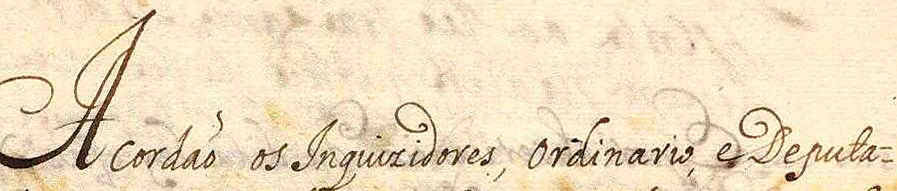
Acordão os Inquizidores, Ordinario, e Deputa
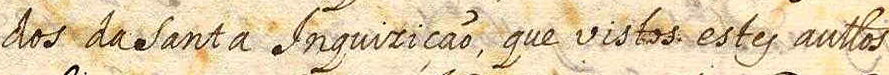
dos da Santa Inquizição, que vistos estes auttos
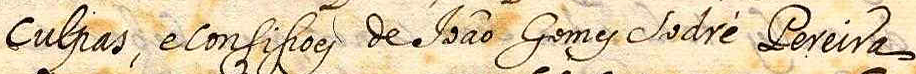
Culpas, e confissoes de Ioão Gomes Sodré Pereira
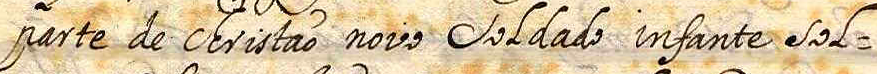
parte de christaõ novo Soldado infante sol
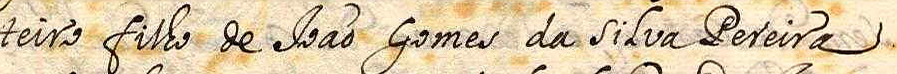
teiro filho de Ioão Gomes da Silva Pereira
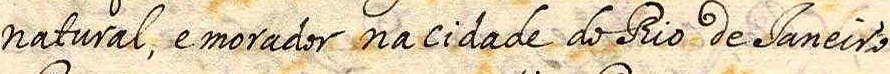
natural, e morador na cidade do Rio de Ianeiro
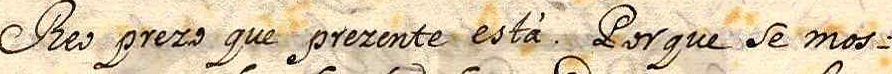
Reo prezo que prezente está. Porque se mos
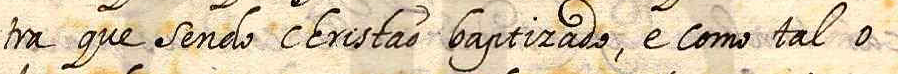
tra que sendo christaõ baptizado, e como tal o
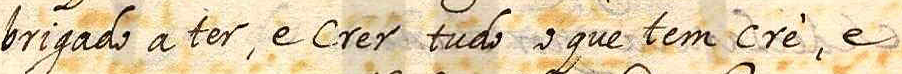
brigado a ter, e crer tudo o que tem cré, e
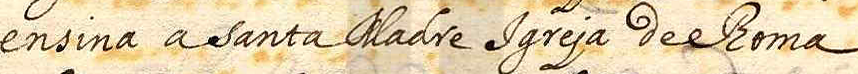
ensina a Santa Madre Igreja de Roma
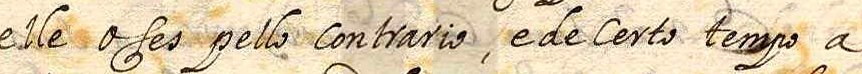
elle o fes pello contrario, e de certo tempo a
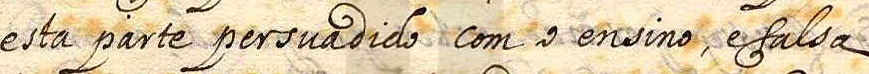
esta parte persuadido com o ensino, e falsa
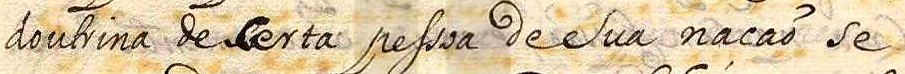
doutrina de certa pessoa de sua naçaõ se
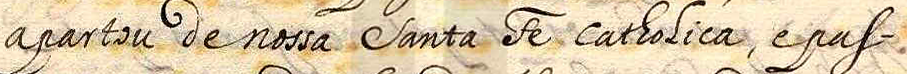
apartou de nossa Santa Fe Catholica, e pas
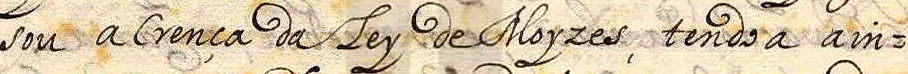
sou a crença da Ley de Moyzes, tendo a ain
